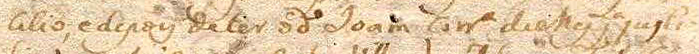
cilio, e depois de ter o do Ioam Corra de Mesqta, justi
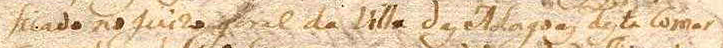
ficado no Juizo geral da Villa das ALagoas desta Comar
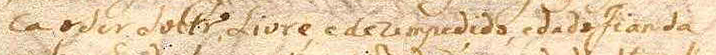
ca o ser soltr.o Livre, e dezimpedido, e dado fiansa
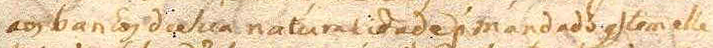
aos banhos de sua naturalidade p̄ mandado q̄ com ele
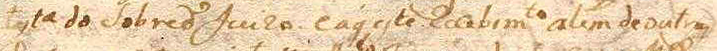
testa do Sobred.o Juizo; e a q̄ este Recebim.to alem de outras
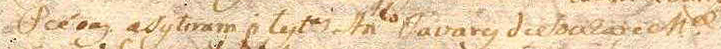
Pesoaz asytiram p̄ testas Anto Tavares de Souza e M.el
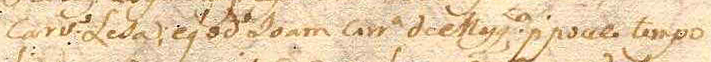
Carv.o Lesa; e q̄ o d.o Ioam Corra de Mesq.ta p̄ pouco tempo
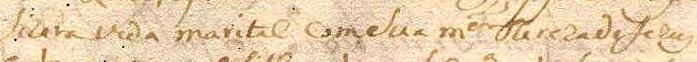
fizera vida marital com Sua m.er Thereza de Jezus
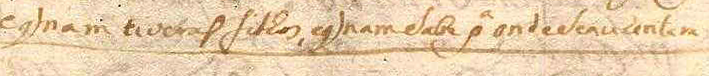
e q̄ nam tiveraõ filhos, e q̄ nam Sabe pa onde se auzentara
